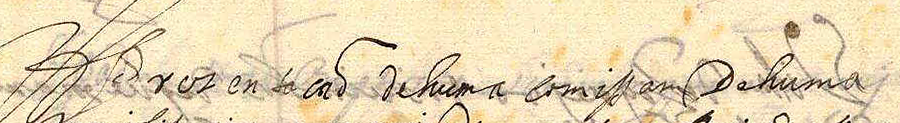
Aprezentaçaõ de huma comissam De huma
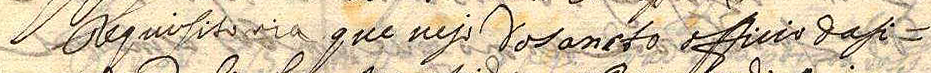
Requisitoria que uejo do sancto officio da si
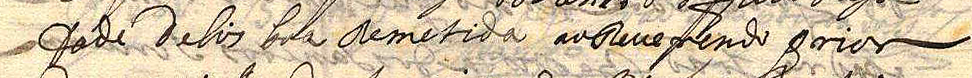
dade de lisboa Remetida ao Reuerendo prior
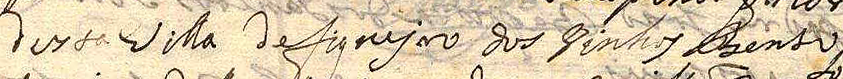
desta Villa de figuejro dos Vinhos Bento
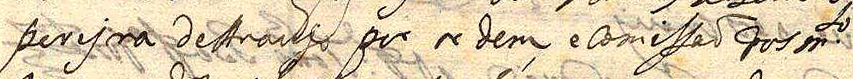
perejra de Araujo por ordem e comissaõ dos m.to
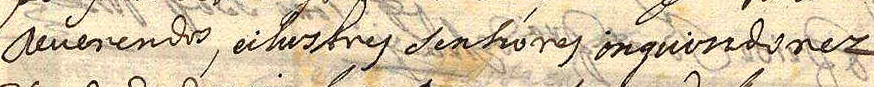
Reuerendos, e ilustres senhores inquisidorez
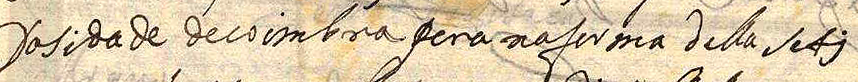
Da sidade de coimbra pera na forma della se tj
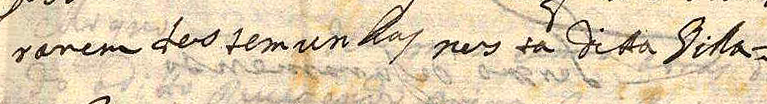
rarem testemunhas nesta ditta Villa
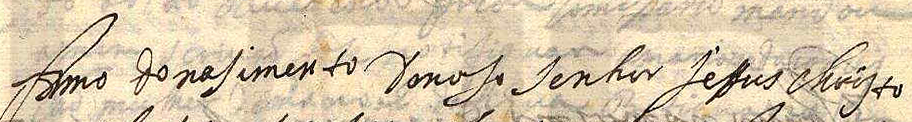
Anno do nasimento Do noso Senhor Jessus Christo
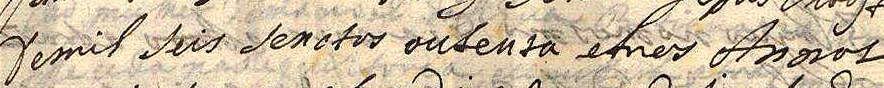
De mil seissenctos outenta e tres Annos
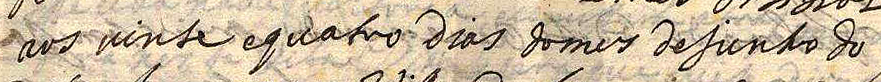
aos uinte e quatro dias do mes de Junho do
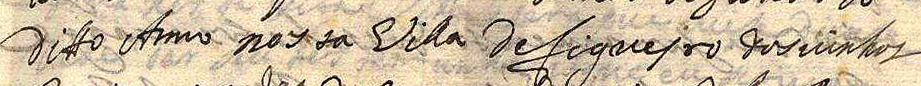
ditto Anno nesta Villa de figuejro dos uinhos
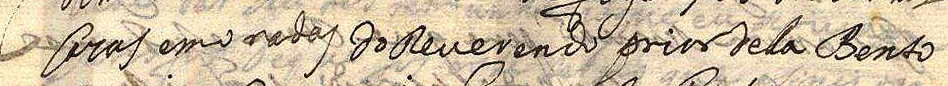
Cazas e moradas do Reuerendo prior della Bento
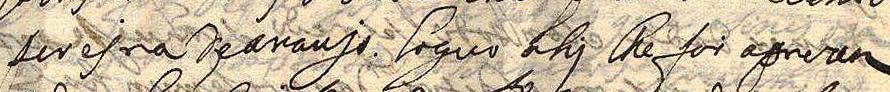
perejra de araujo. loguo ahj lhe foi aprezen
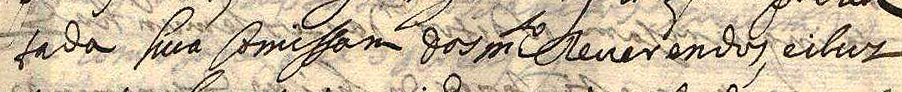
tada huā Comissam dos mto Reuerendos, e ilus
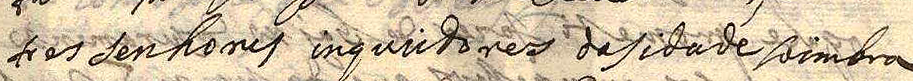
tres senhores inqusidores da sidade Coimbra
